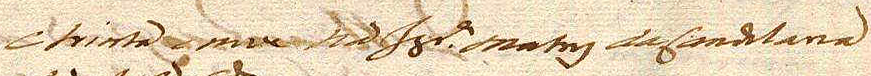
e trinta, e nove na Jgr.a matris da Candelaria
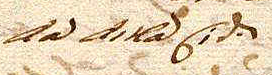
da ditta Cid.e
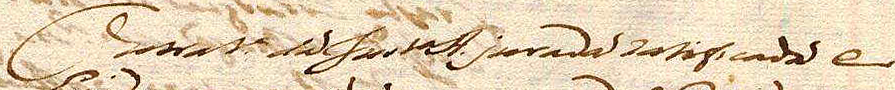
Outra t.a da Justa A. jurada ratificada e
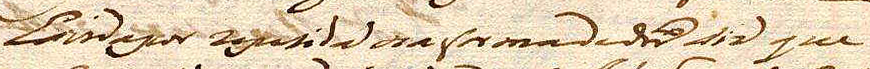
havida por repetida na forma de drto diz que
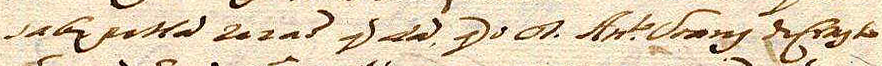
sabe pella Razaõ q̄ da, q̄ o R. An.to Soares de Crasto
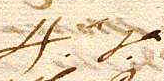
4.a t.a
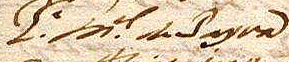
Pe. M.el de Payva
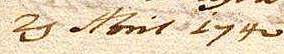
29 Abril i740
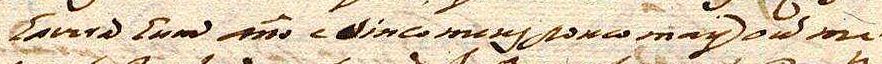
havera hum ano e sinco mezes pouco mais ou me
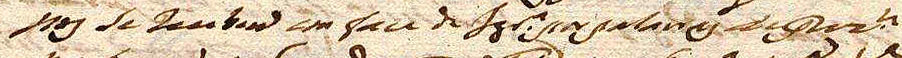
nos se Recebeu em face da Igr.a por palavas de prez.te
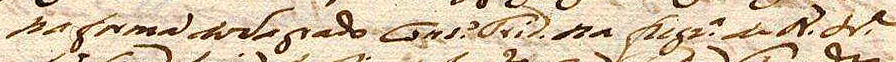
na forma do Sagrado Cons.o Trid. na fregz.a de N. Sr.a
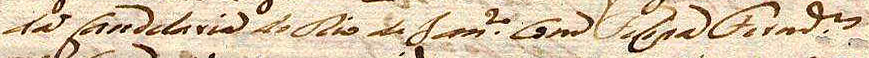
da Candelaria do Rio de Jan.ro Com Filipa Fernd.es
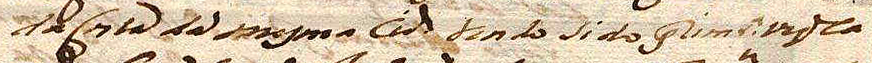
da Costa da mesma cid.e tendo sido pRimr.a ves ca
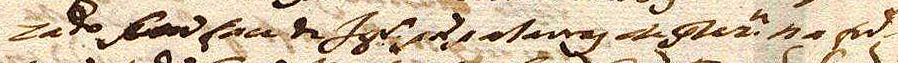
zado em face de Jgr.a por palavras de pRez.te na for
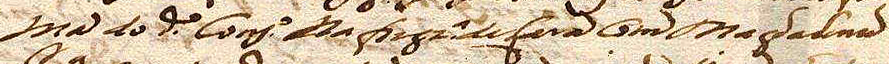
ma do d.o Cons.o na fregz.a de fora com Magdalena
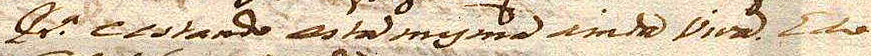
Pr.a e estando esta mesma ainda viva. E do
